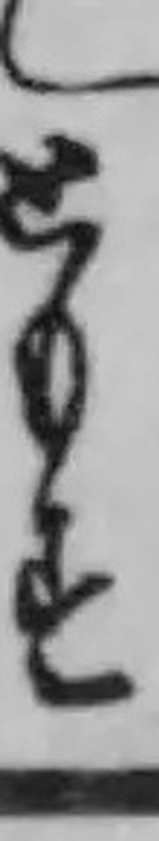ともす
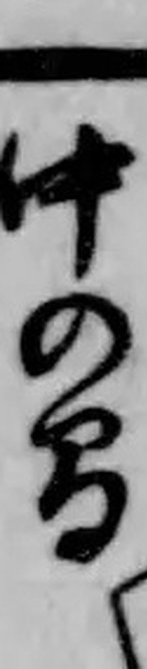中の間
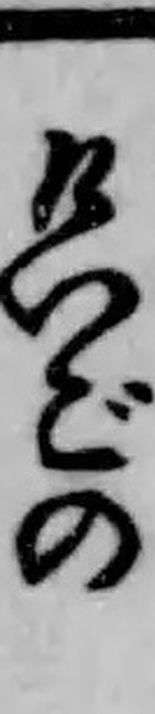けいごの
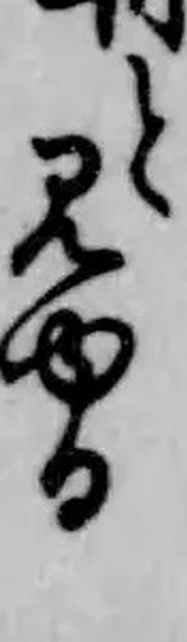見ゆる
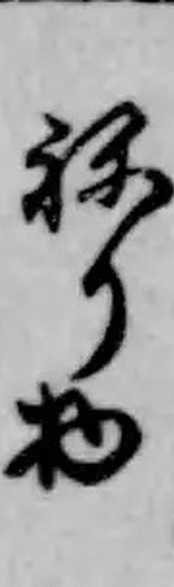ねり物
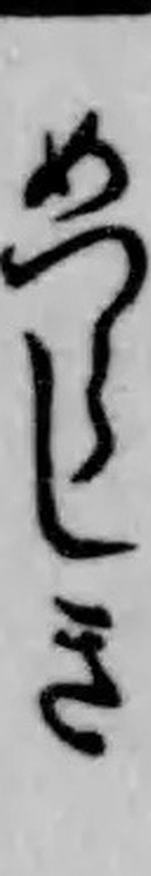めつらしき
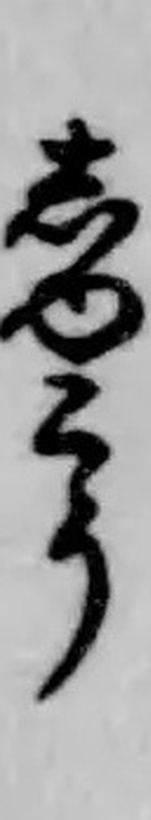しゆこう

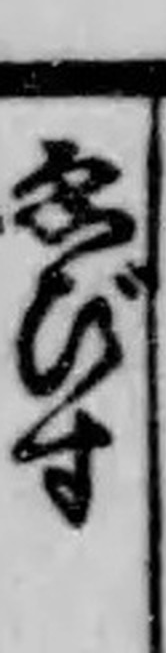ゑびす
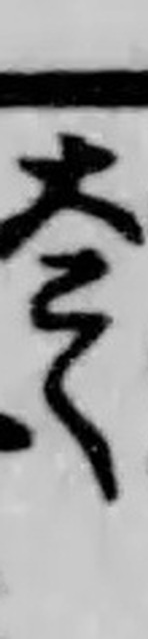大こく
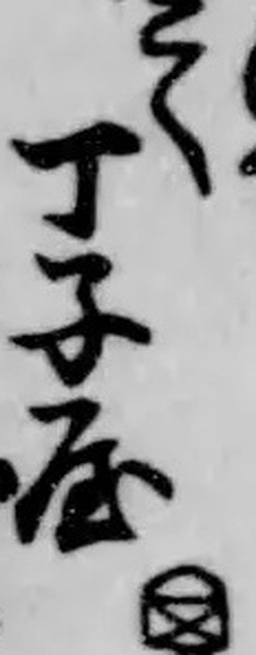丁子屋
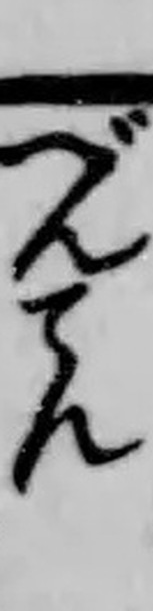べんてん
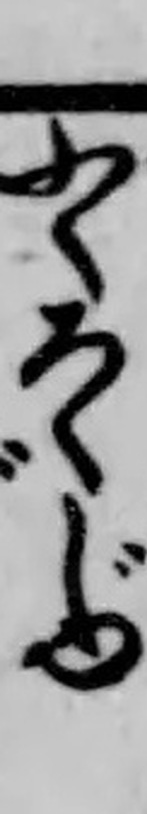ふくろくじゆ
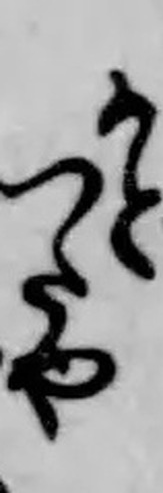つたや
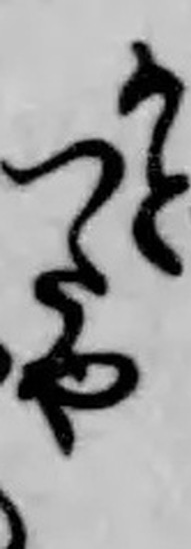つたや
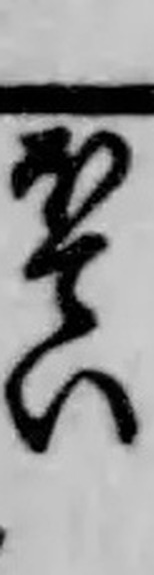ほてい
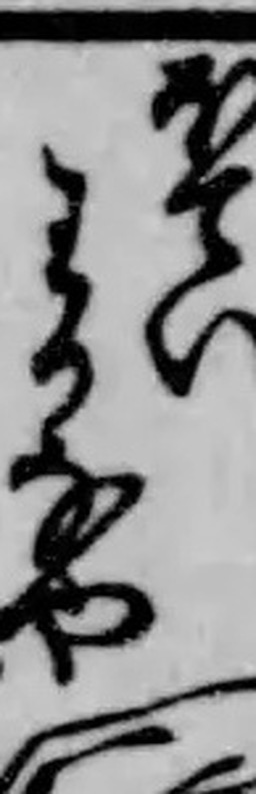わかなや
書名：明月余情. 第1編
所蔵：国立国会図書館 National Diet Library, JAPAN
